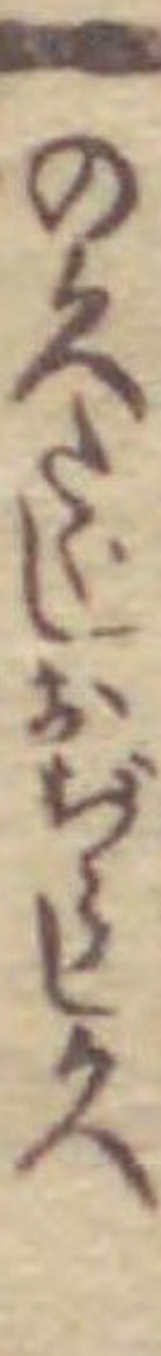のかへたゞしおぢらしかへ
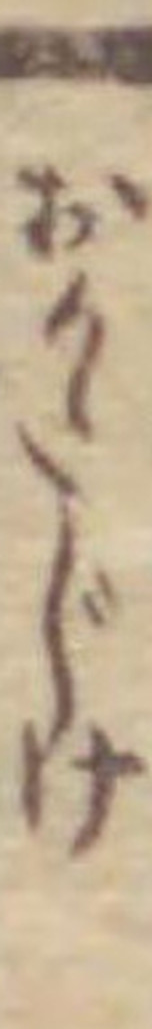おかたじけ
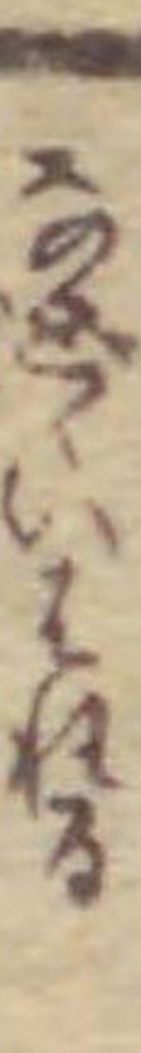などゝいはれる
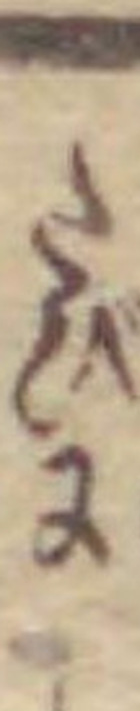たびに
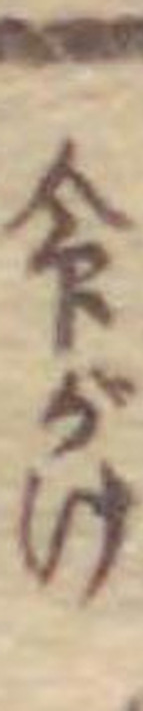命がけ
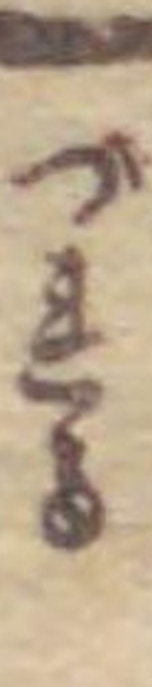づれる

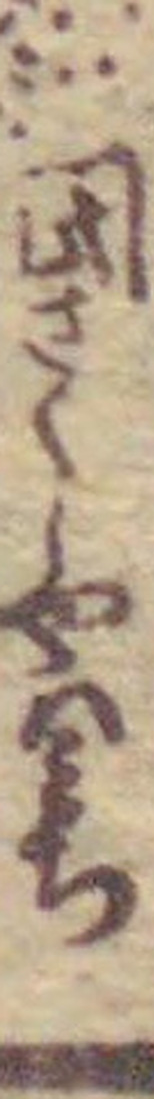〽此さくしやはみち
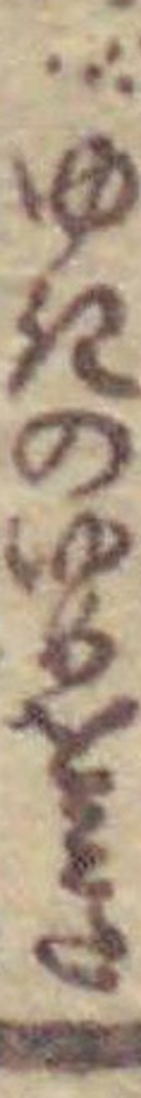ゆきのゆめをみた
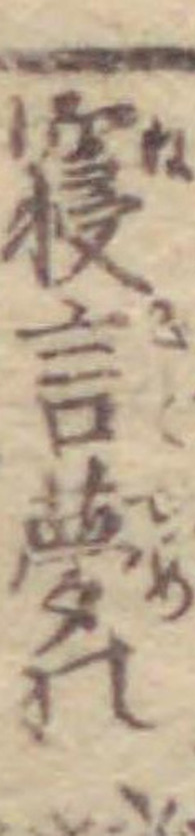寝言夢の
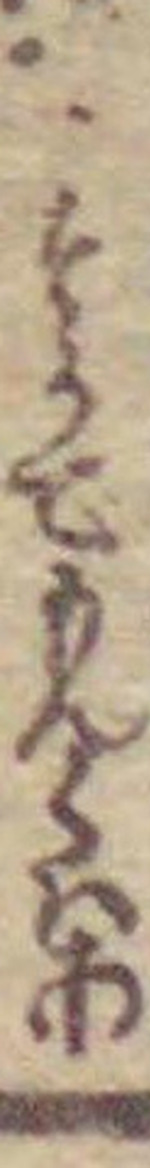そうてもんくはあ
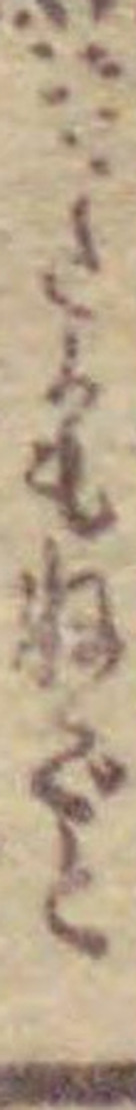たかもねごと
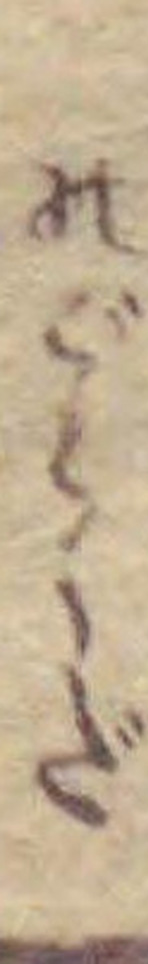のごとしだ
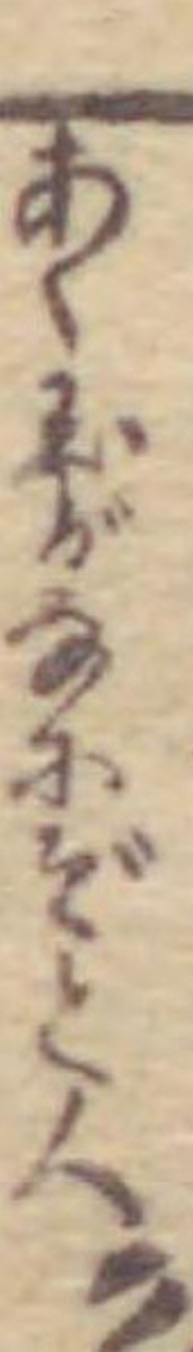あく玉がなにぞと人
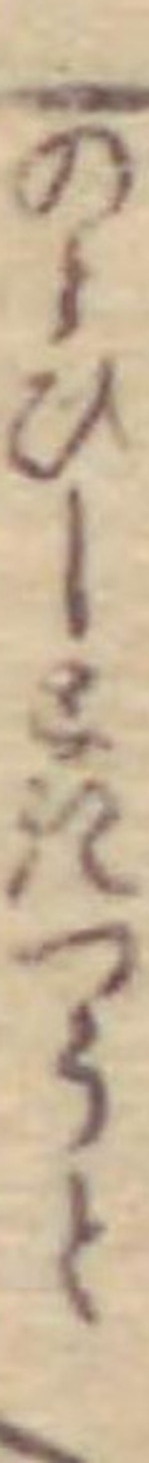のとひしときつうと
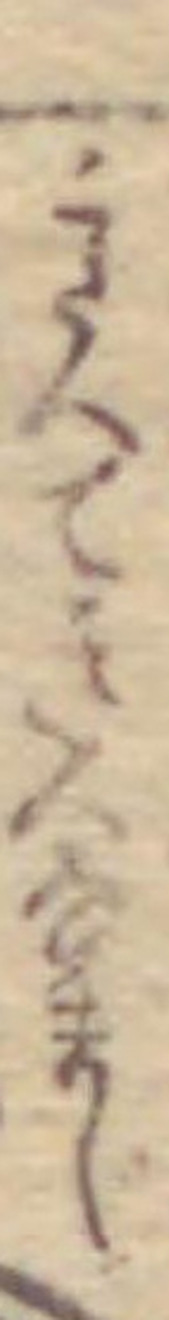こたへてきへなまじ
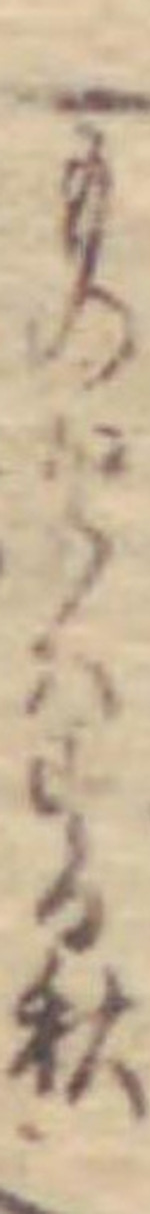ものおもはする秋
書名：御誂染長寿小紋 : 3巻
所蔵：国立国会図書館 National Diet Library, JAPAN
